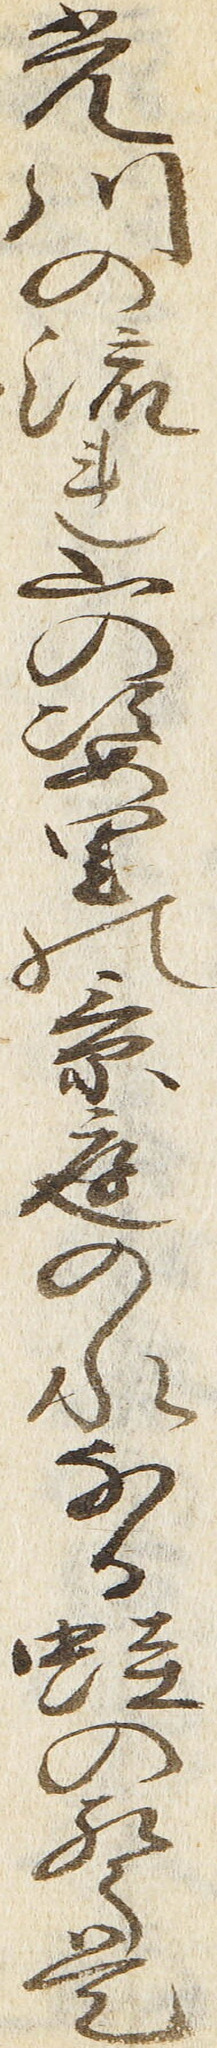光川の流れ山の姿里の景庭の水なる蛙の声是
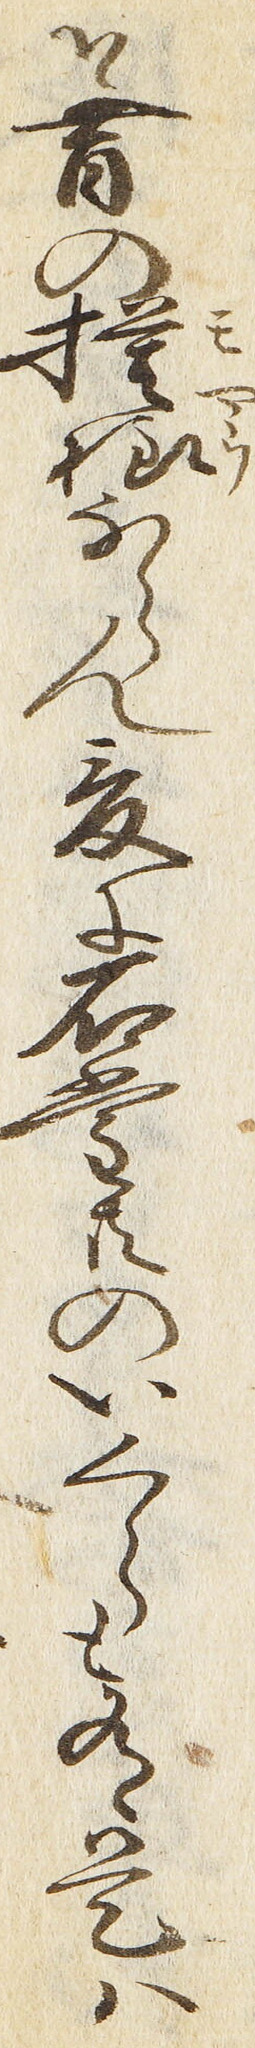そ昔の模様ならん爰に石堂共のいくらも有是は
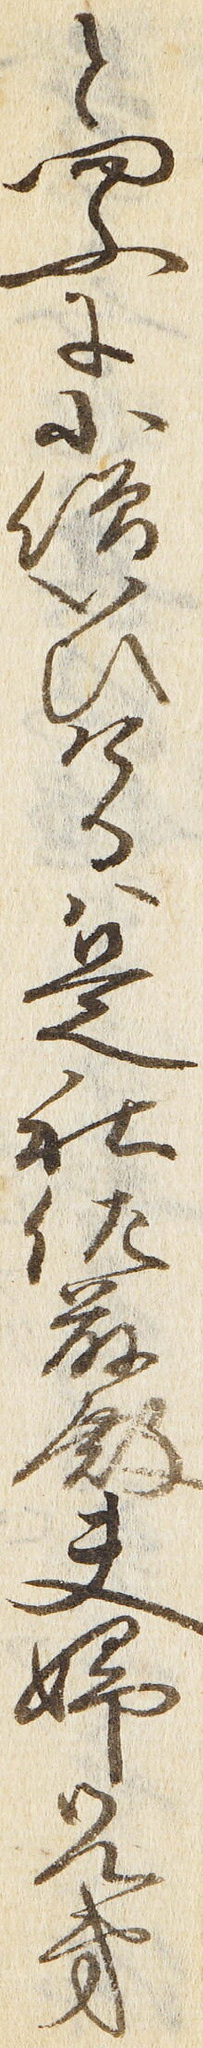と問ふに小僧いひけるは是社佐藤殿夫婦兄弟
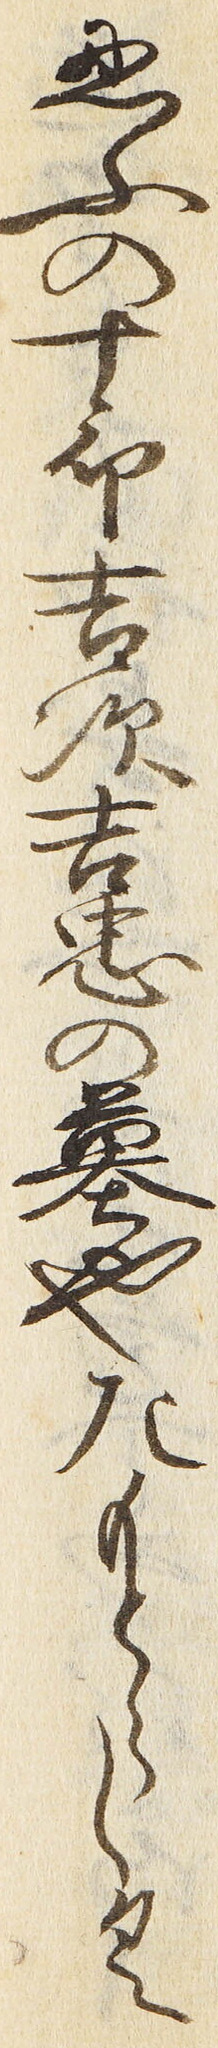忍ふの十郎吉次吉忠の墓也さもとらしく
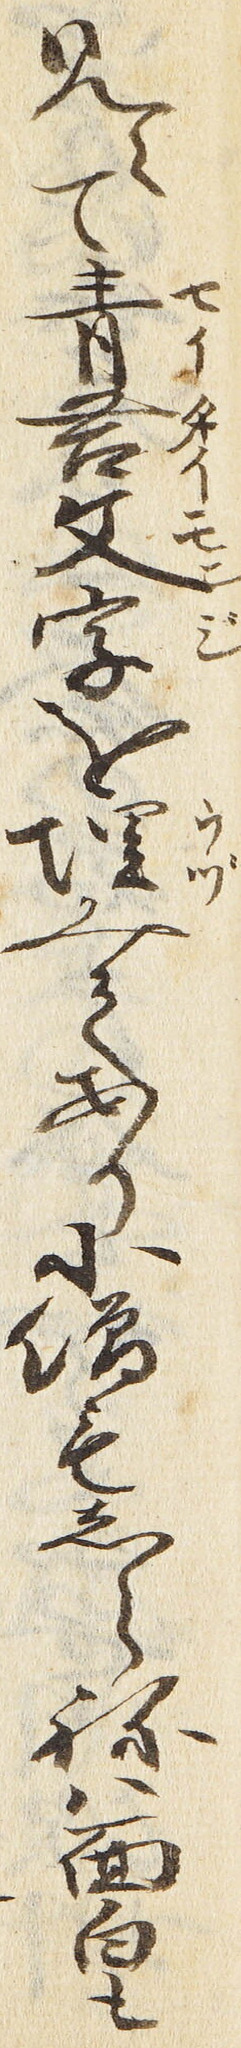見えて青苔文字を埋みてあり小僧もしらねは面白も
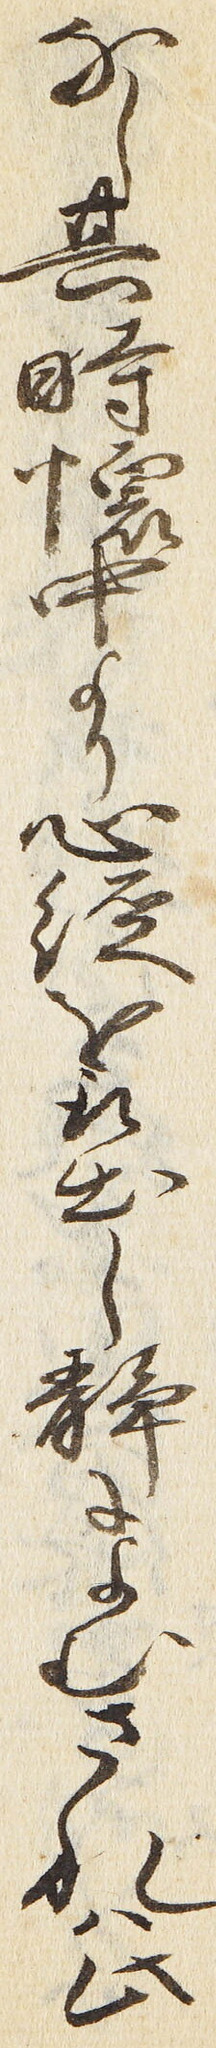なし其時懐中より心経を取出し静によむされは此
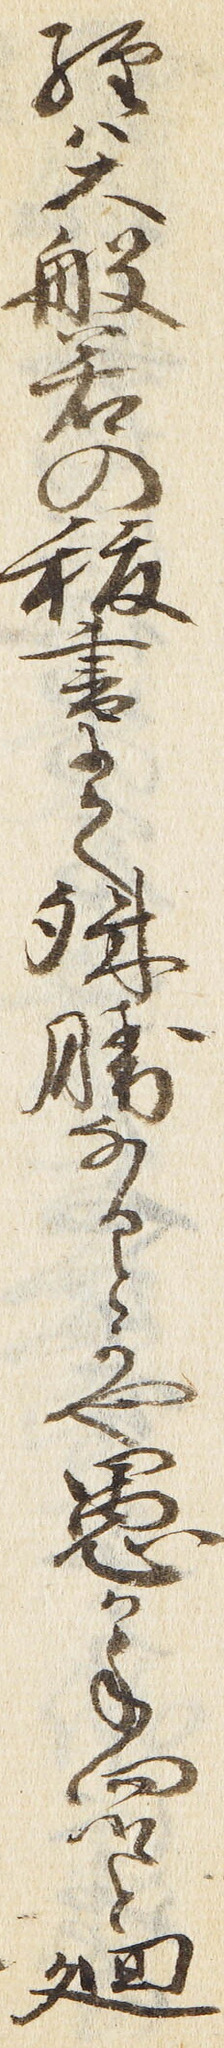経は大般若の抜書にて殊勝なるとかや愚か手向そと廻
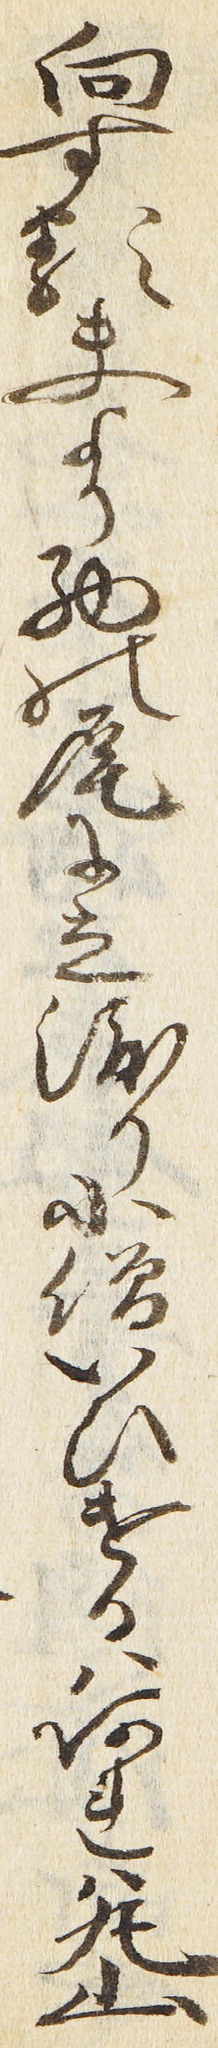向する夫より西の尾に立渡り小僧いひけるはあれは丸山
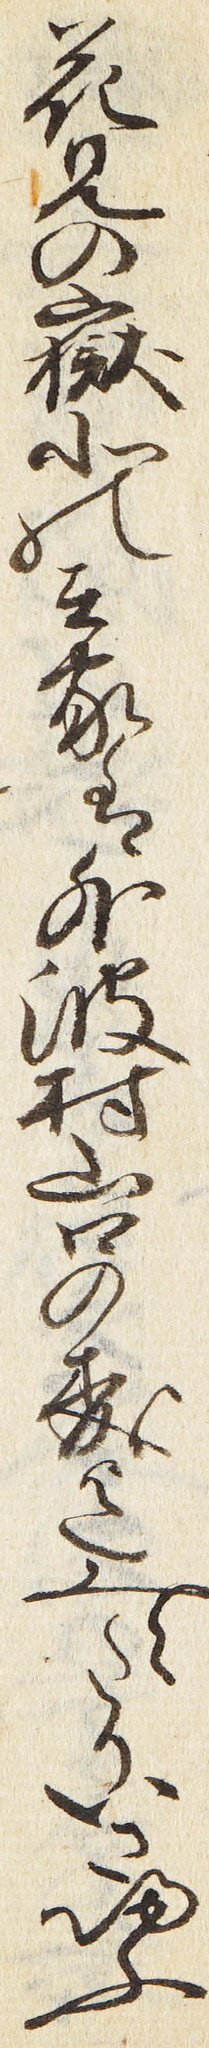花見の嶽北の在家は外波村山口の森迄みえたりいさ帰ふ
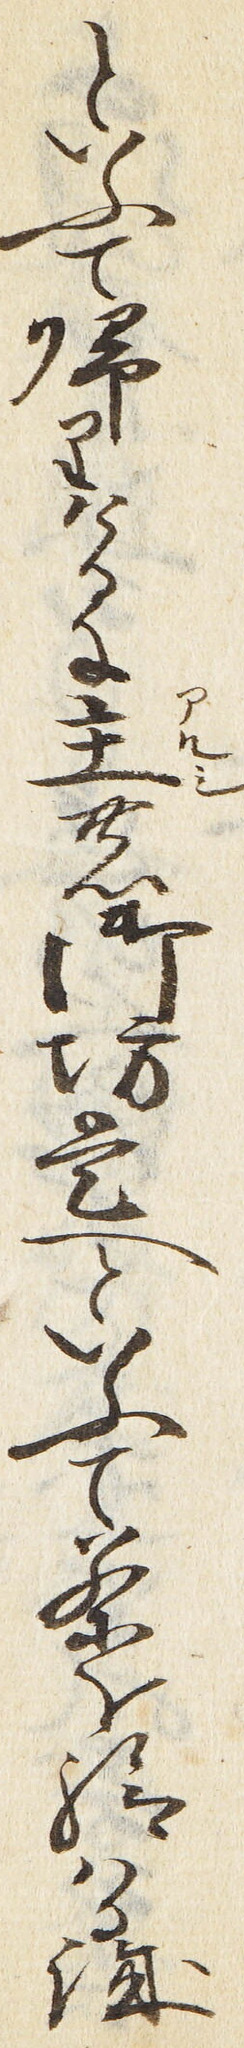といふて帰りけるに主先御坊是へといふて茶を給はる誠
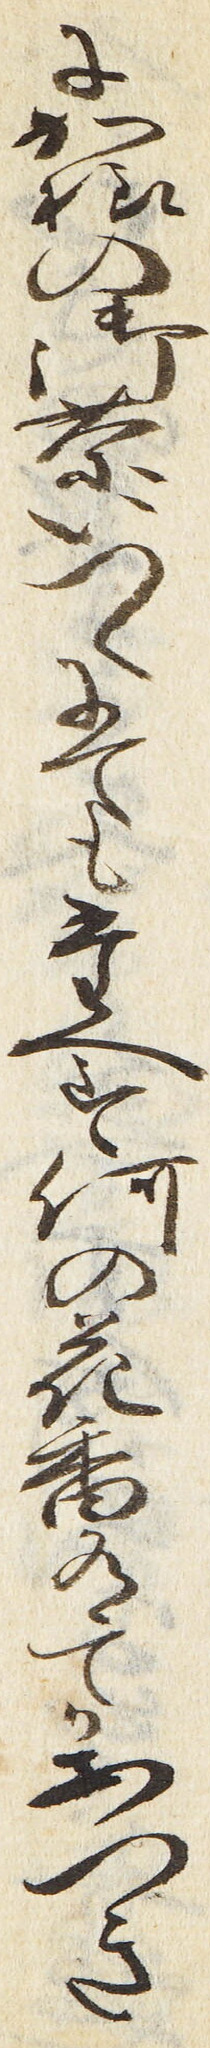にか様の御茶いつくにてもたへす何の花香有てかあつき
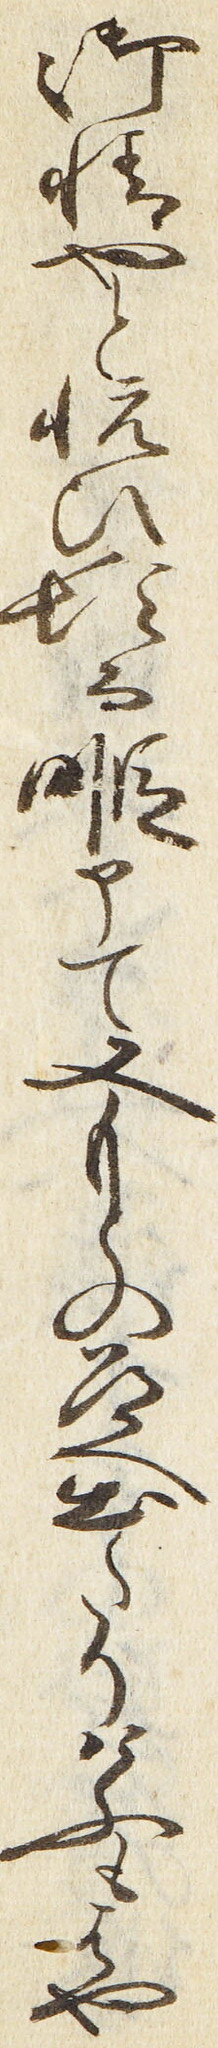御情やと悦ひ頓而暇申て又もとの道へ出たりけふもはや
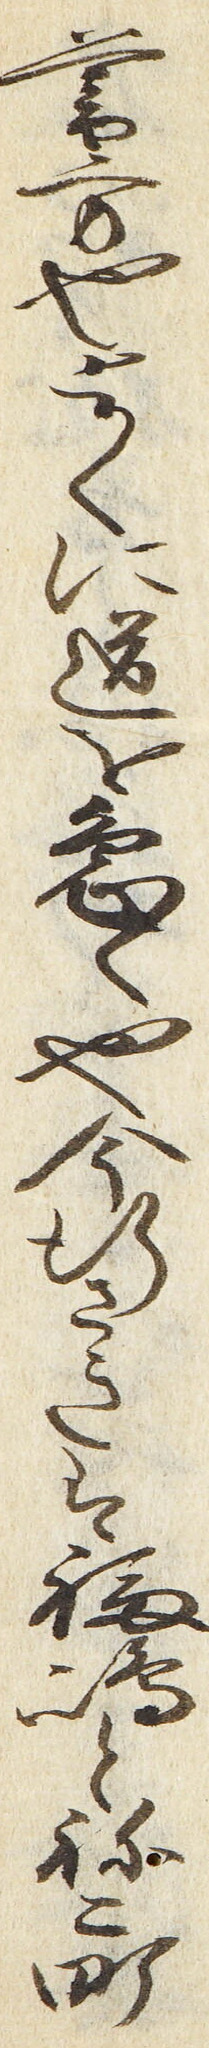暮方やとかくに道を急くや今行さきは福嶋とねこ町

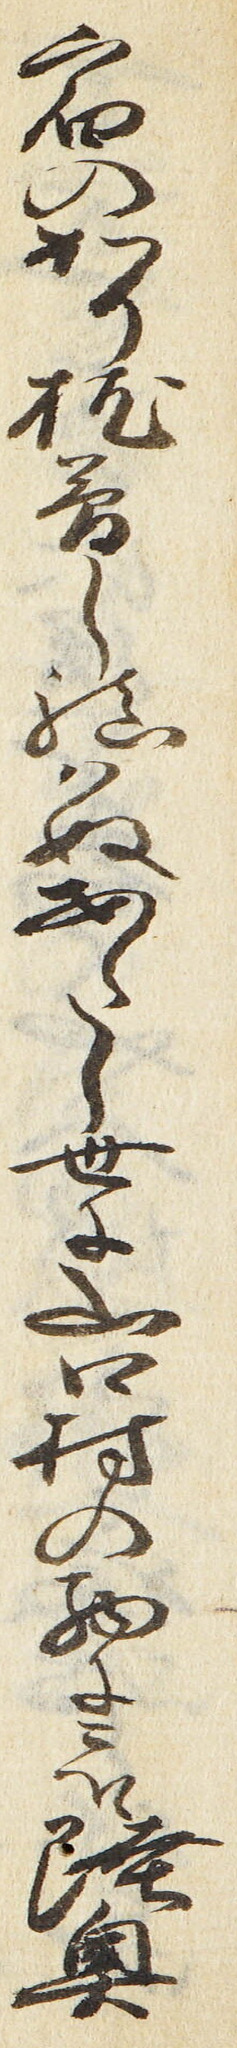宿のかり枕し結はぬあたし世に山口村の西にこそ睦奥
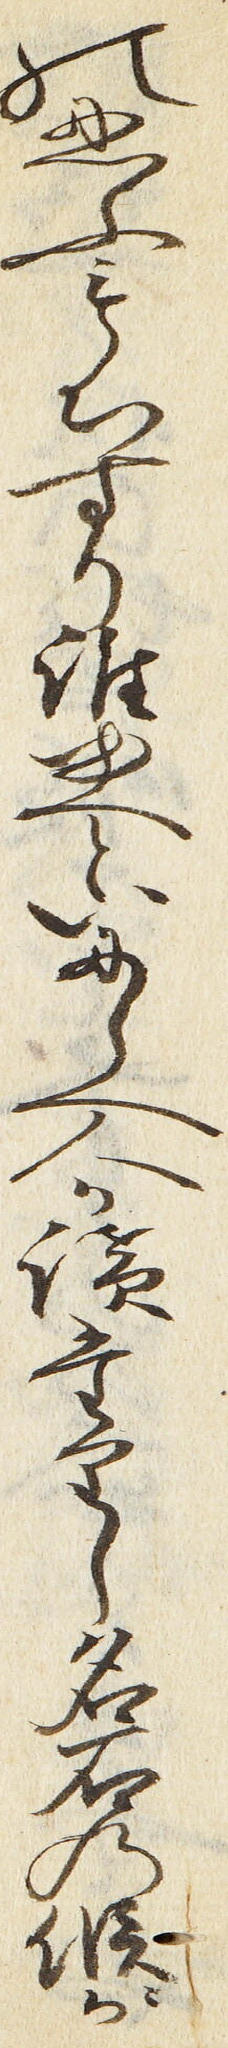の忍ふもちすり誰ゆへといにしへ人か読たりし名石の候が
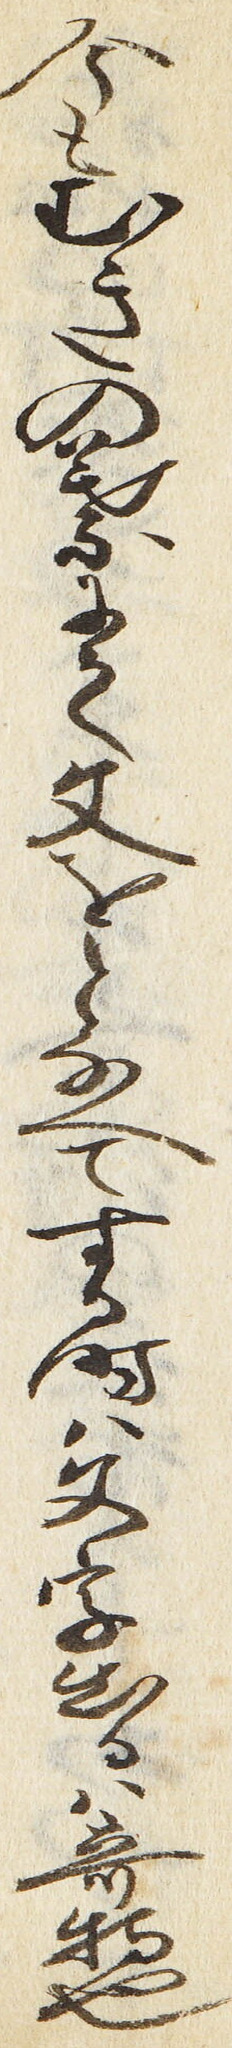今もむきの葉にて文をとなへてする時は文字出るは奇特也
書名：海陸世話日記
